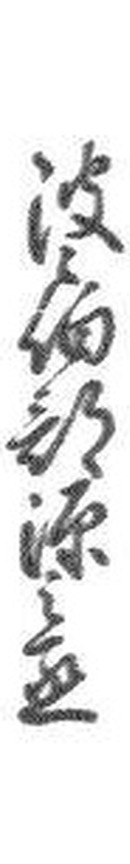波々伯部源之丞
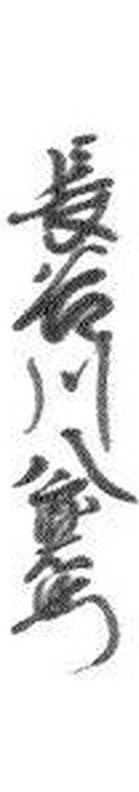長谷川八郎右衛門
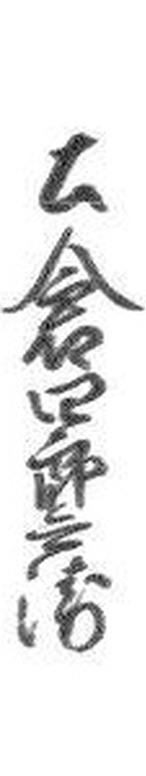土倉四郎兵衛
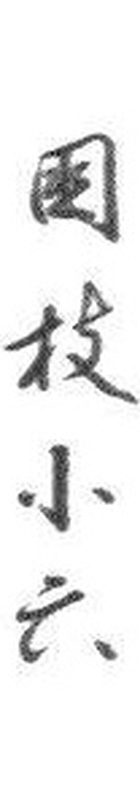国枝小六
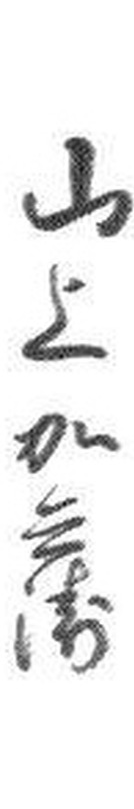山上加兵衛
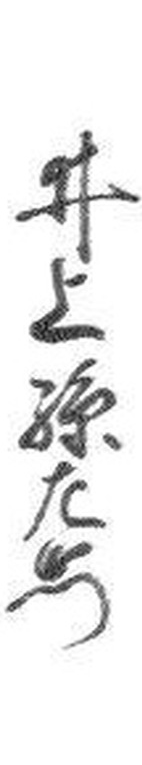井上孫左衛門
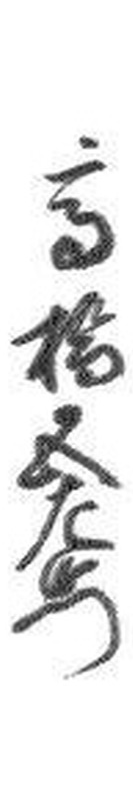高橋五左衛門
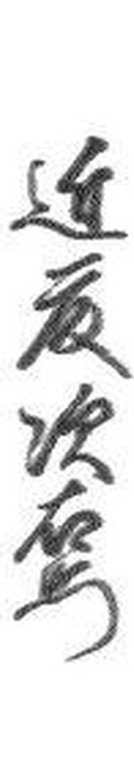近藤次右衛門

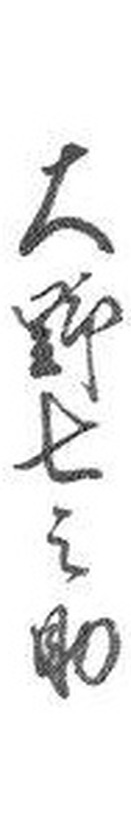大野七之助
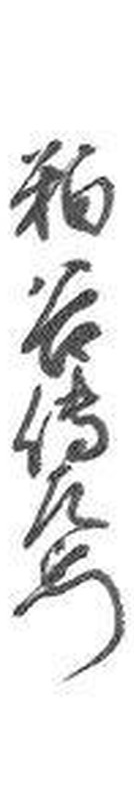粕谷伝左衛門
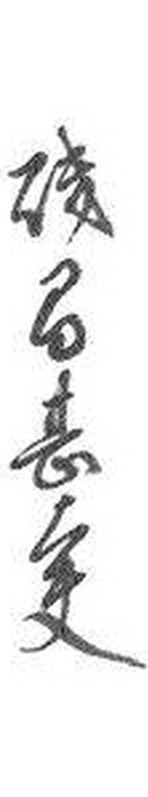磯間甚太夫
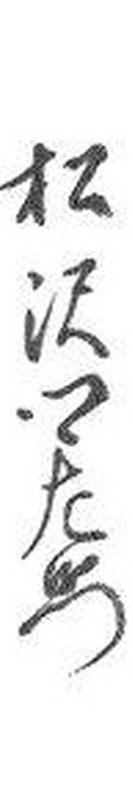松沢郷左衛門
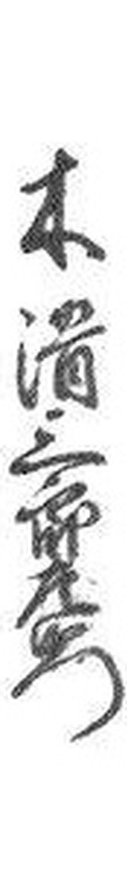木滑三郎左衛門
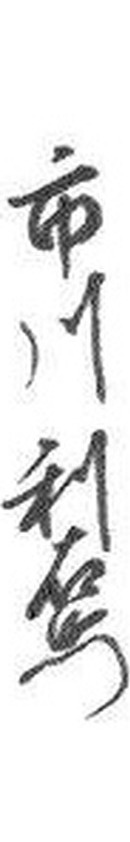市川利右衛門
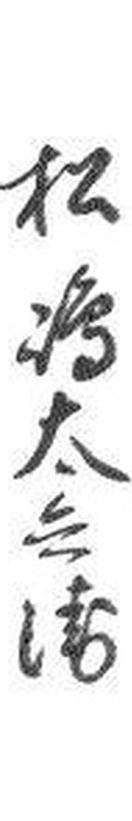松島太兵衛
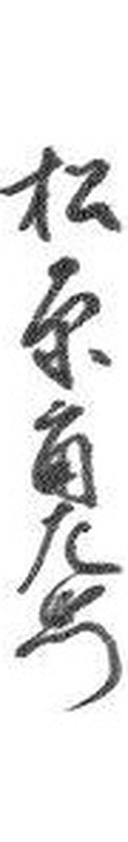松原角左衛門
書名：家譜 四 忠昌公 従寛永七年到正保四年
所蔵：福井県文書館 Fukui Prefectural Archives
